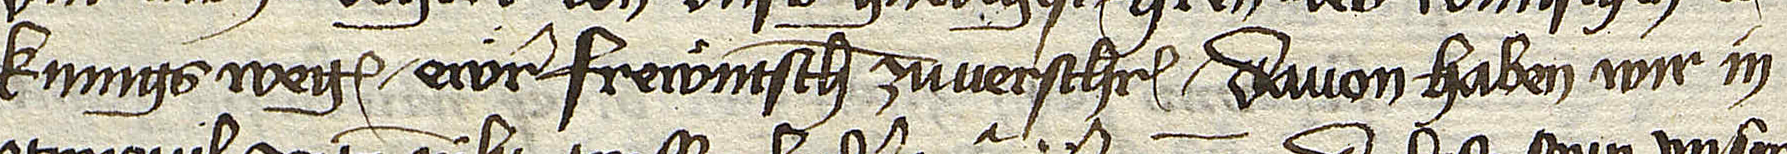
kunigs weg* / eẅr* freẅntſch* ʒuuerſchr* / dauon haben wir in
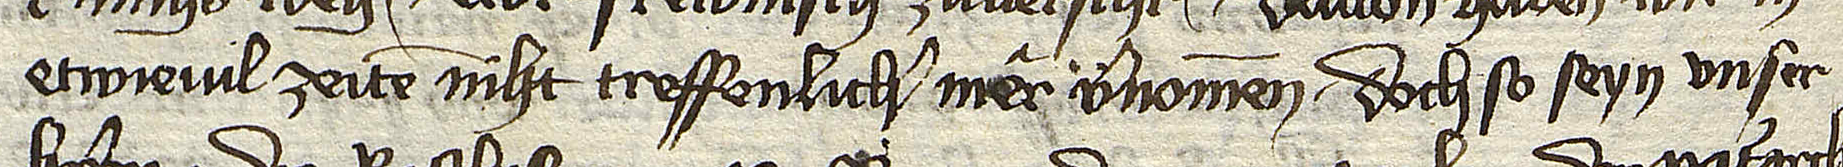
erwieuil ʒeite* niht treffenlich* mër v*nomen* / Doch ſo ſeyn vnſer
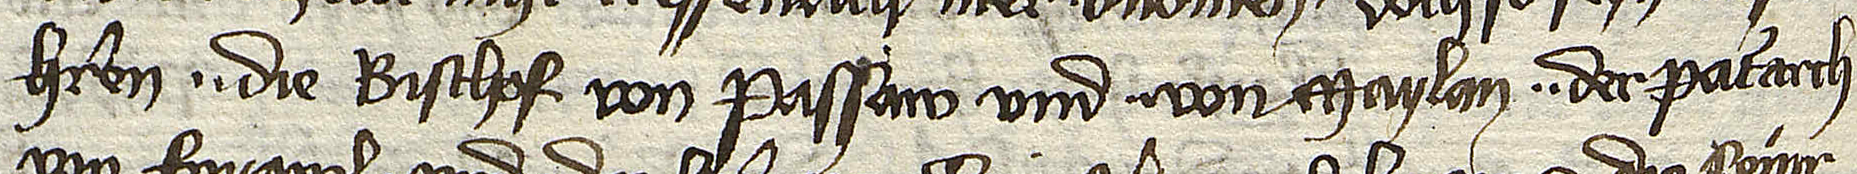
hr*en ~ die Biſchof von Paſſaw vnd ~ von Maylan ~ der Pat*arch
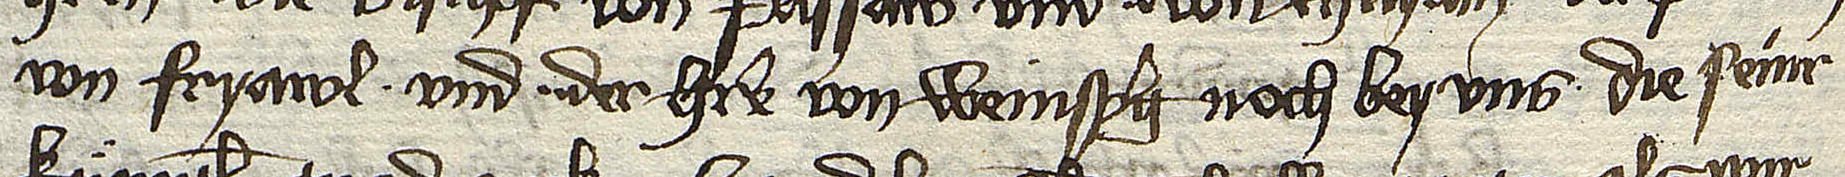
von fryawl . vnd ~ der hr*e von weinſp*g noch bey vns . die ſeinr
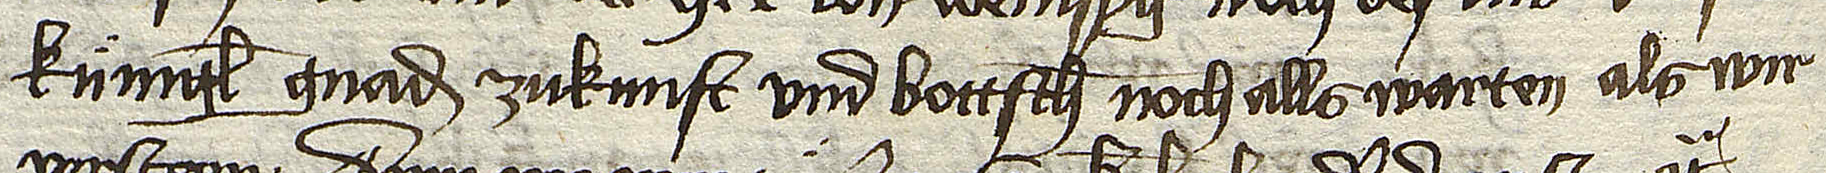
künigl* gnad* ʒukunft vnd bottſch* noch alls warten als wir
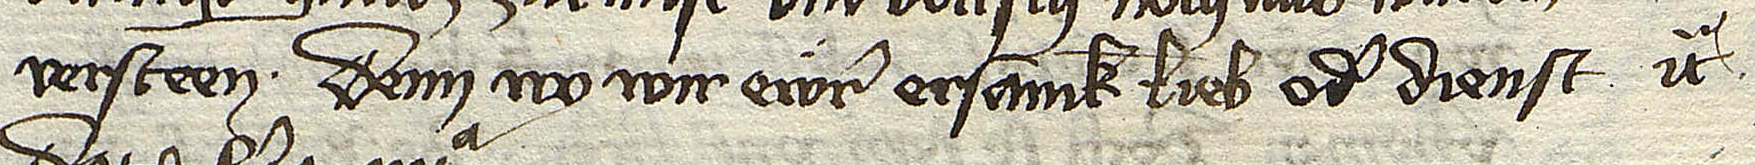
verſteen Denn wo wir eẅr* erſamk* lieb od* dienſt ec*
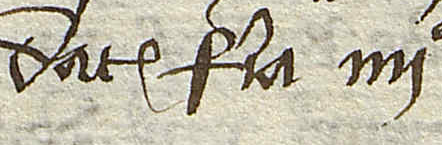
Dat* fia* iiii*
